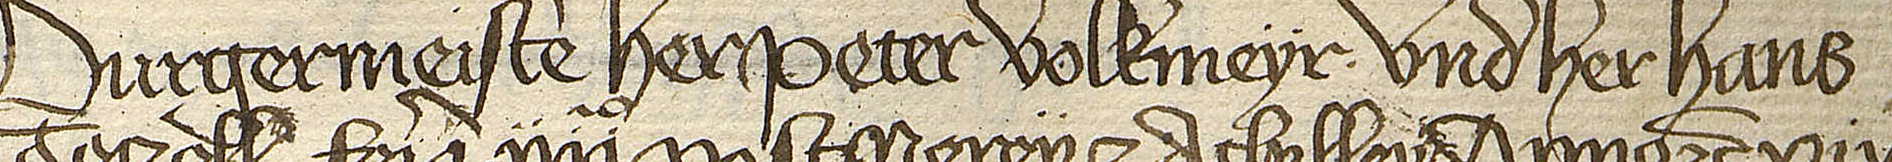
Burgermeiſte* Her Peter Volkmeyr Vnd Her Hans
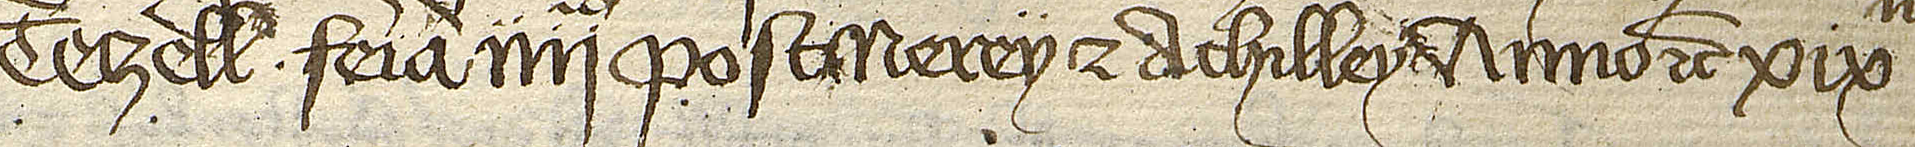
Tecʒell . feia* iiii* poſt Nerey @ Achilley Anno ec* xix*
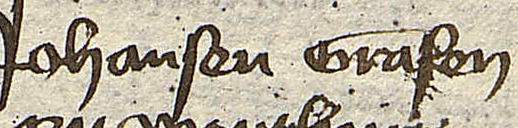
Iohanſen Grafen
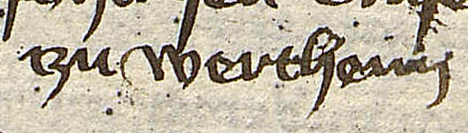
cʒu wertheim
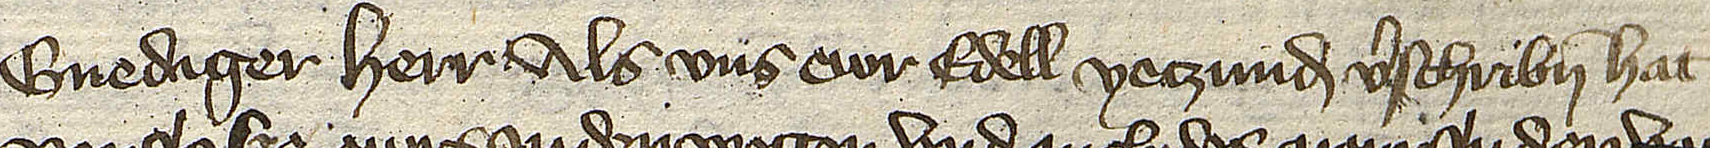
Gnediger herr Als vns ewr Edell yecʒund* v*ſchribn* hat
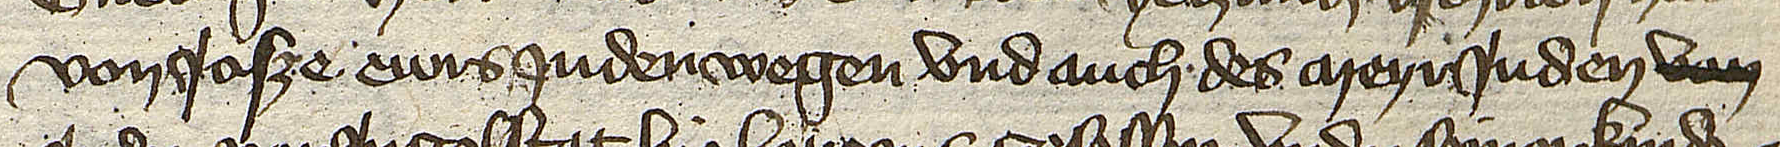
von Ioſʒe ewrs Iuden wegen vnd auch des Meyr Iuden von
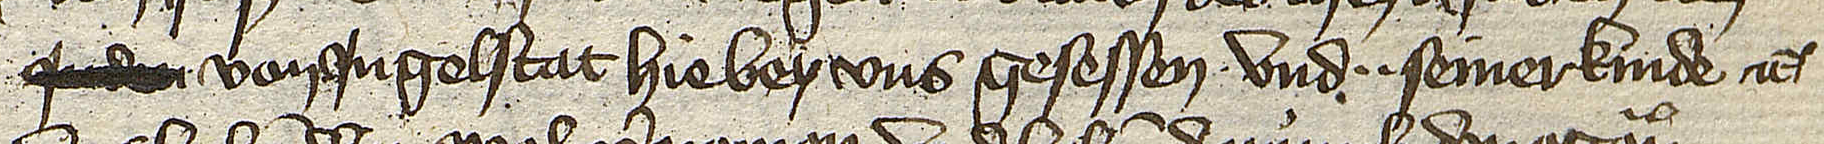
Iuden von Ingelſtat hie bey vns geſeſſen . Vnd ~ ſeiner kinde ec*
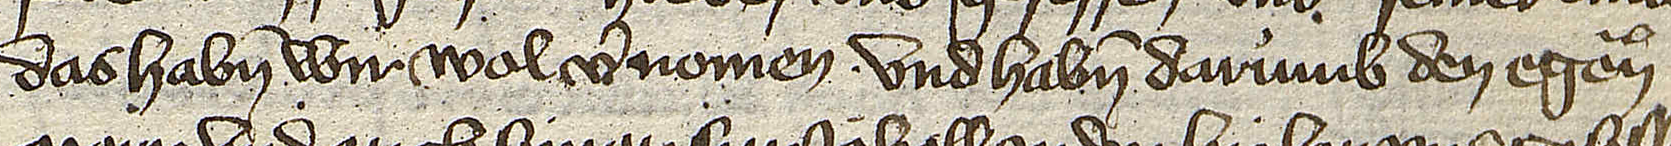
das habn* wir wol v*nomen . vnd habn* darümb den egen*
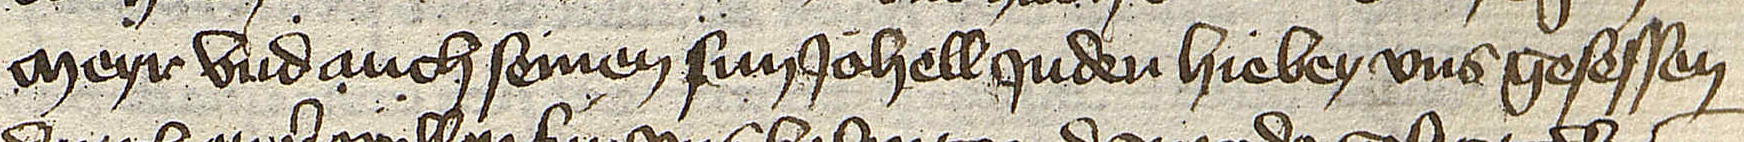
Meyr vnd auch ſeinen ſun Iohell Iuden hie bey vns geſeſſen
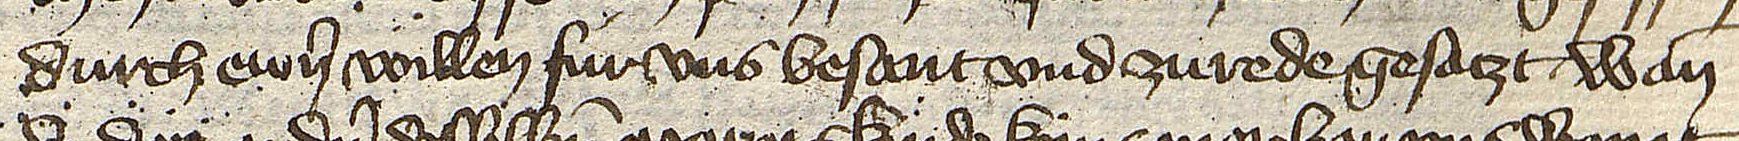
durch ewn* willen fur vns beſant vnd cʒurede geſacʒt / wan*
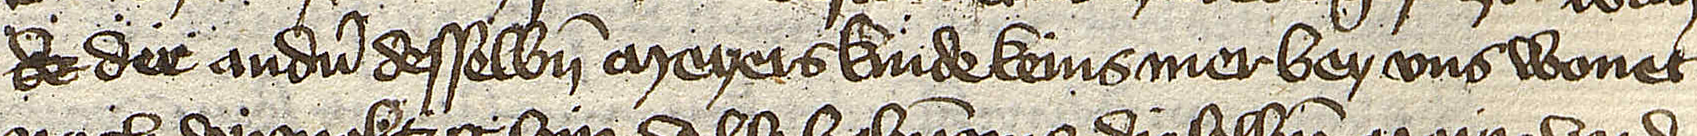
de der andn* deſſelbn* Meyers kinde keins mer bey vns wonet
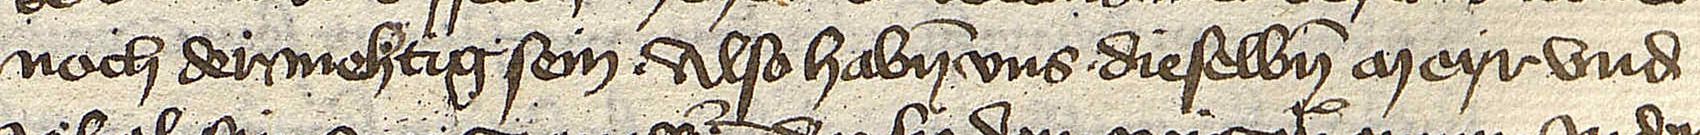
noch dermehtig ſein . Alſo habn* vns dieſelbn* Meyr vnd
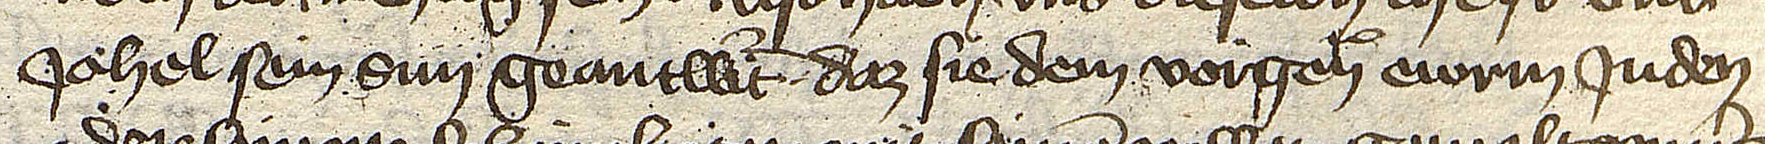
Iohel ſein Sun geantw*t . daʒ ſie dem vorgen* ewrm Iuden
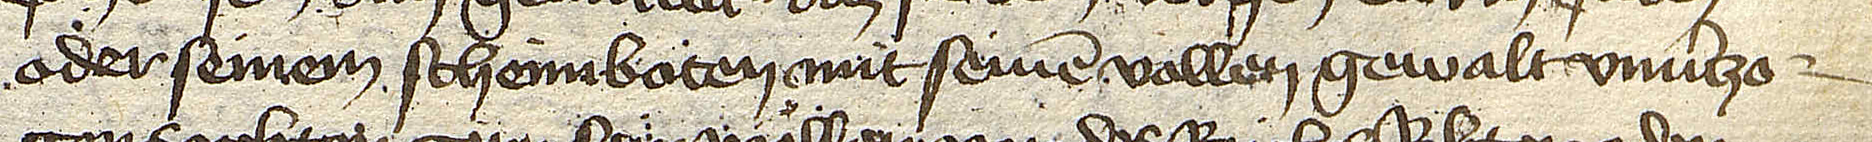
oder ſeinem ſcheimboten mit ſeine* vollen gewalt vnu*cʒo =
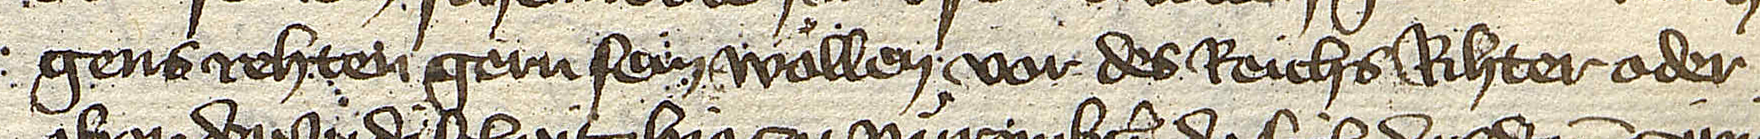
gens rehten gern ſein wöllen vor des Reichs Rihter oder
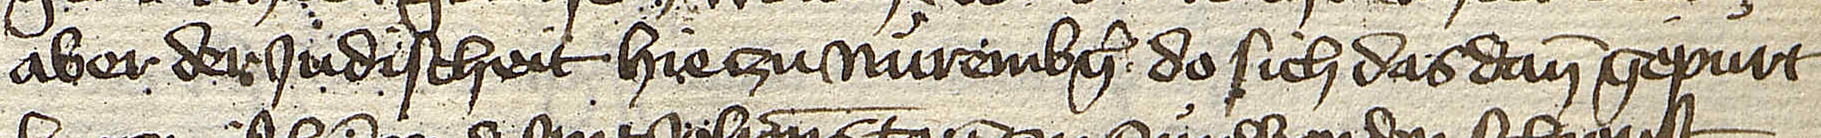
aber der Iudiſcheit hie cʒu Nürembg* do ſich das dan* gepürt
